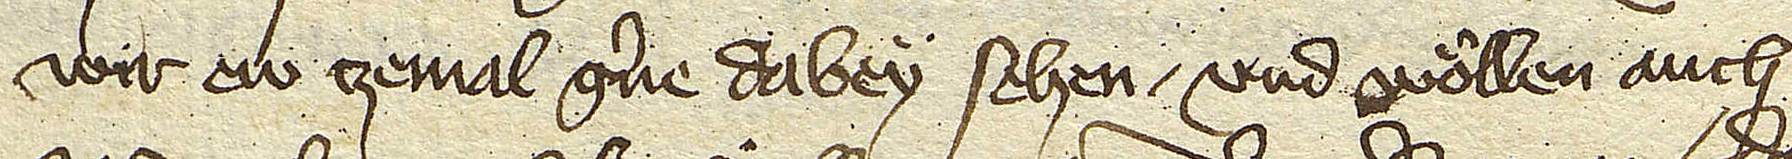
wir ew cʒemal g*ne dabey ſehen / vnd wöllen auch
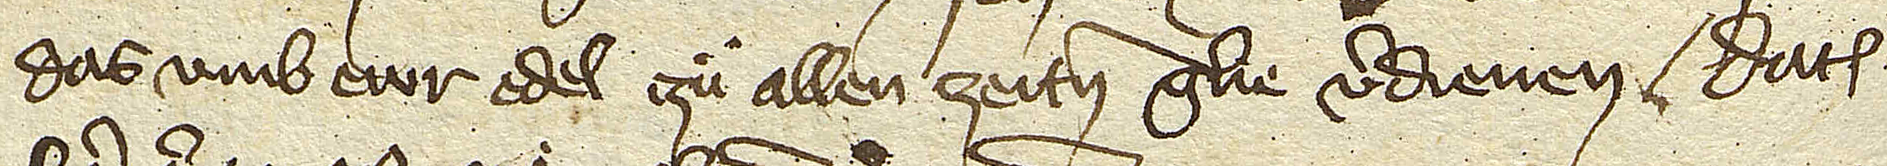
das vmb ewr edel cʒü allen cʒeitn* g*ne v*dienen / dat*
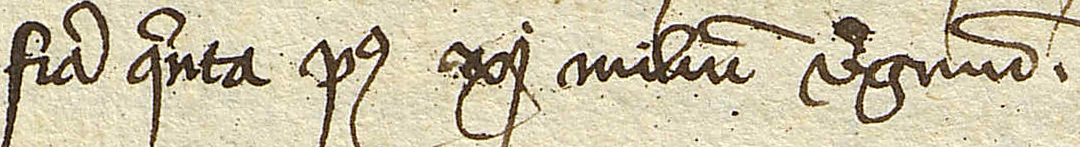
fia* qnta* p* xi miliu* vgmu*.
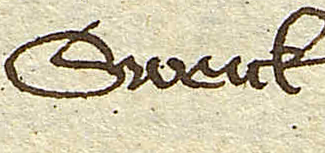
Sweick*
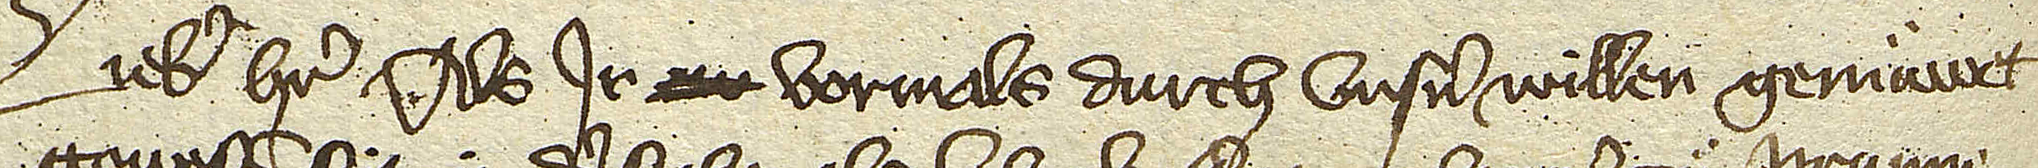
Lieb* hr* / Als Ir ew vormals durch vnſn* willen gemüwet
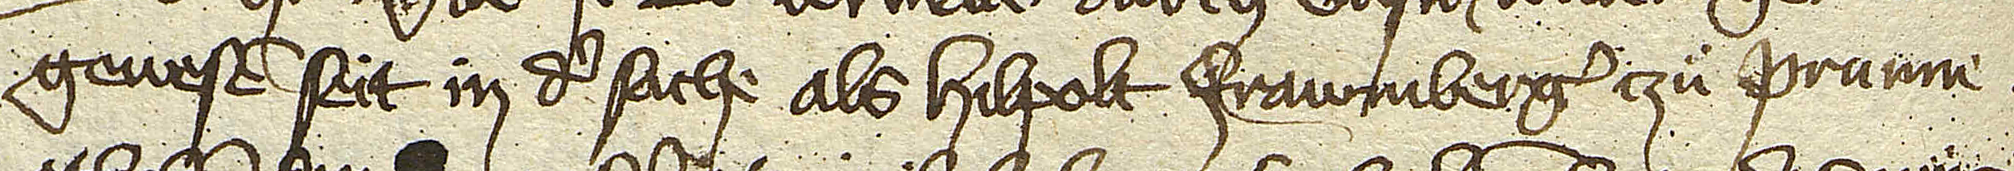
geweſe* ſeit in d* ſache als Hilpolt Frawmberg* cʒü Prunne
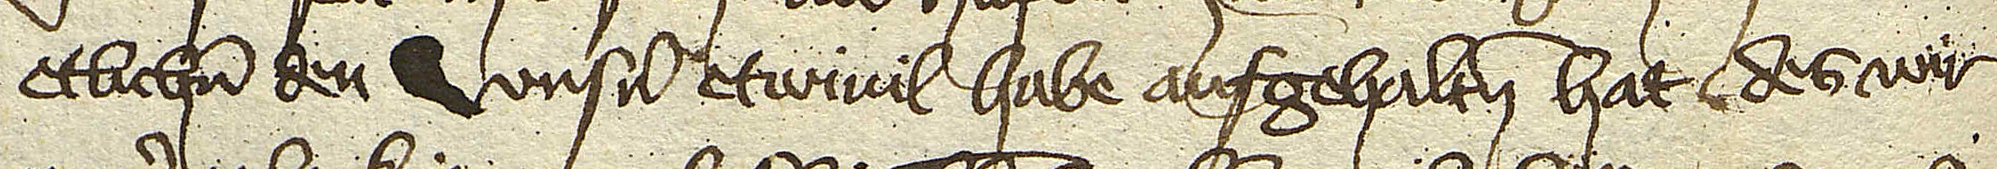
etlichn* den v vnſn* etwiuil habe aufgehaltn* hat / des wir
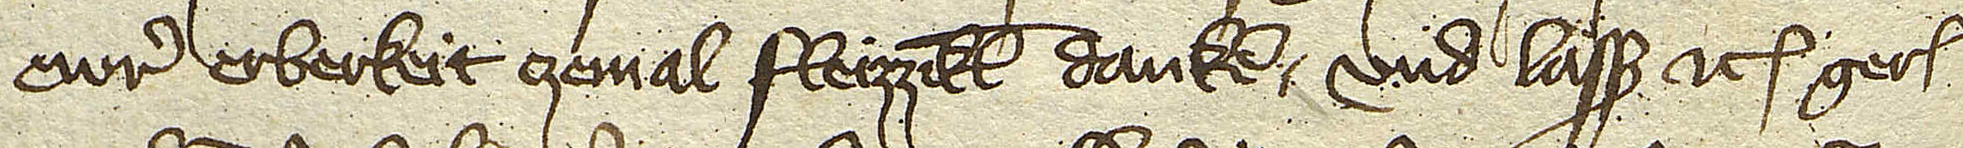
ewr* erberkeit cʒemals fleiʒʒikl* danke* / vnd laſſ* ec* ger*
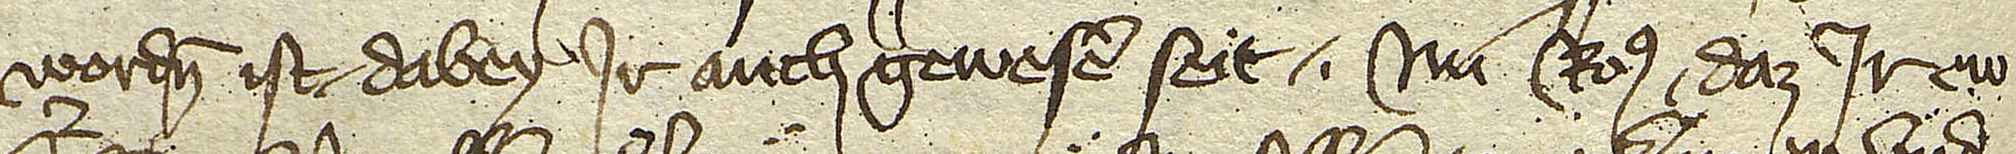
wordn* iſt / dabey Ir auch geweſe* ſeit / . Nu Ro* / daʒ Ir ew
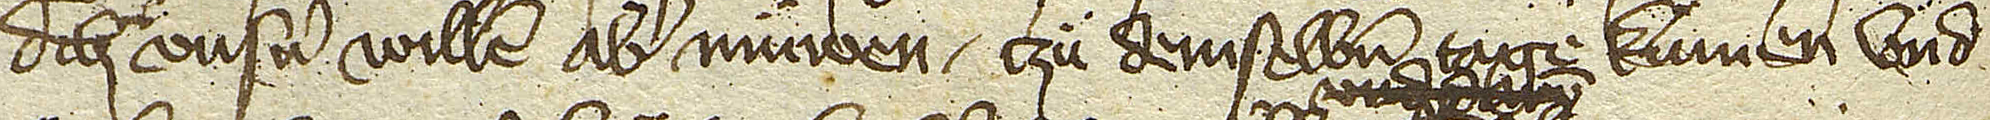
d*ch vnſn* wille* ab* müwen / cʒü demſelbn* tage kumen vnd
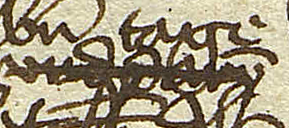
vnd dary*
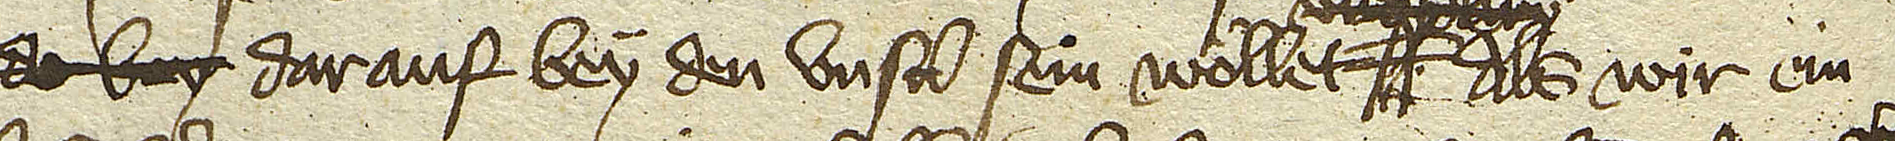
do bey darauf bey den vnſn* ſein wöllet Als wir ein
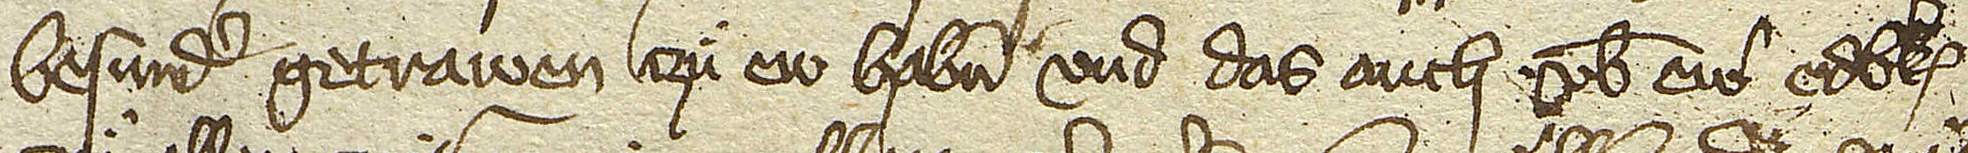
beſund* getrawen cʒü ew habn* vnd das auch vb* ew* erbk*
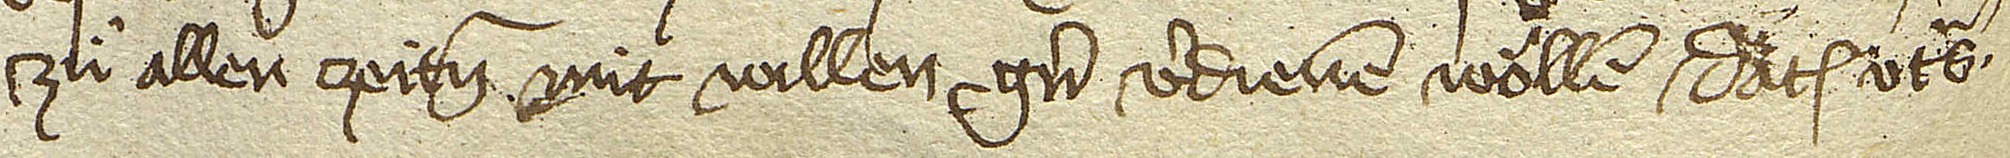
cʒü allen cʒeitn* mit willen gn* v*diene* wölle* / Dat* vts* .
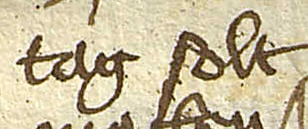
tag ſolt
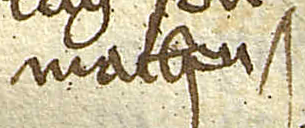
machen
